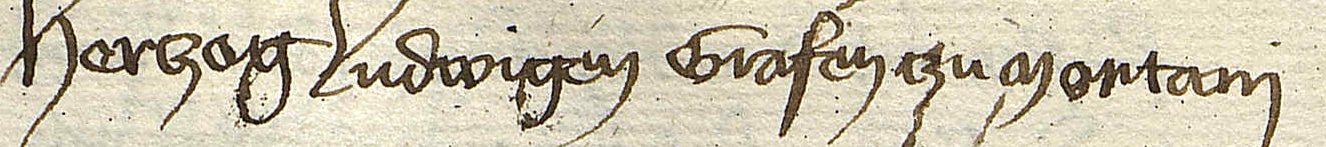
hercʒog Ludwigen Grafen cʒu Mortani
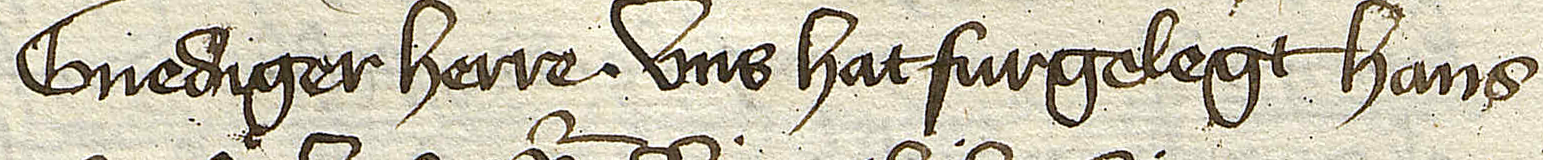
Gnediger herre . Vns hat furgelegt hans
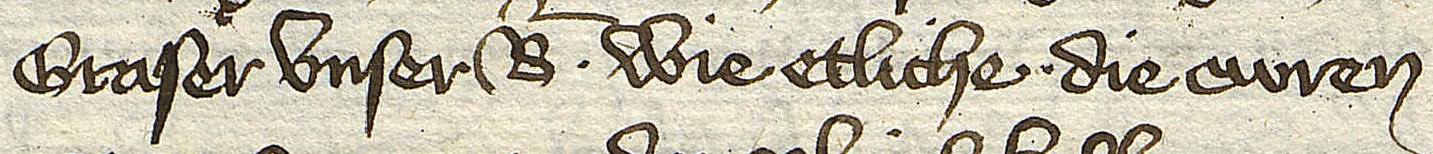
Graſer vnſer B* . wie etliche ~ die ewren
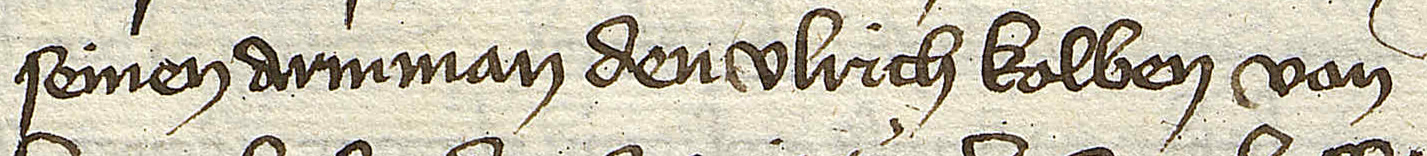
ſeinen Armman den vlrich kolben von
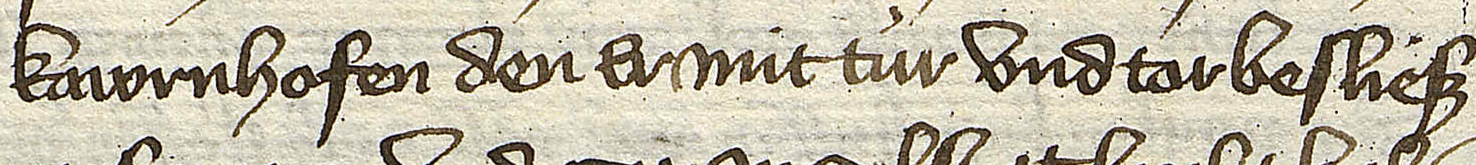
kawrnhofen den Er mit tür vnd tor beſlieſʒ
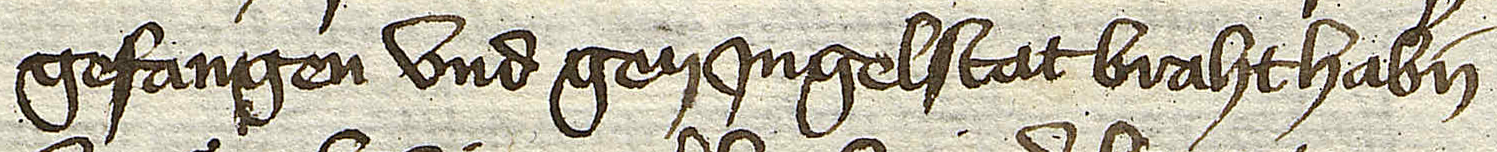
gefangen vnd gen Ingelſtat braht habn*
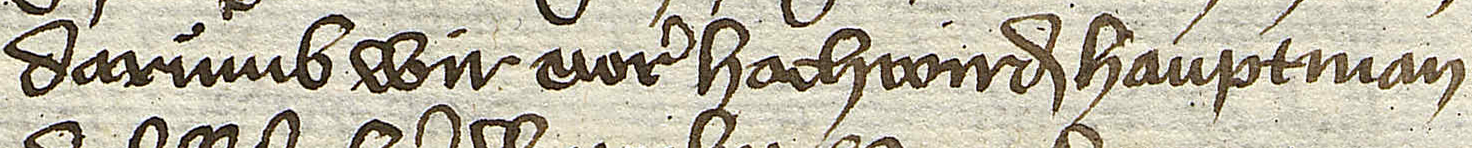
darümb wir ewr* hochwird* hauptman
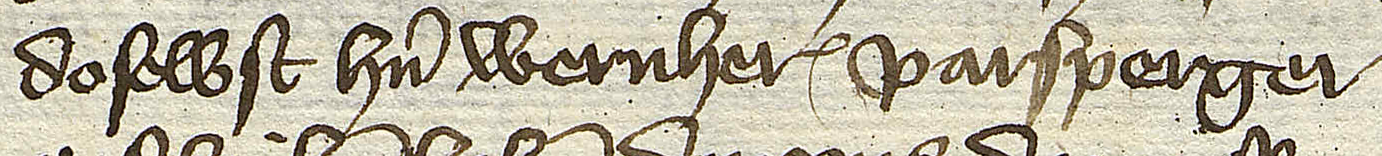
doſelbſt hn* wernher* Parſperger
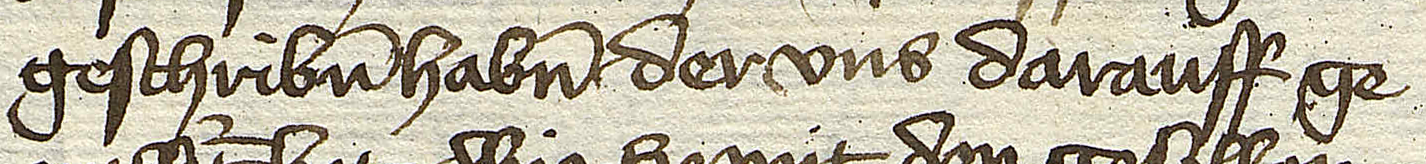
geſchribn* habn* / der vns darauff ge
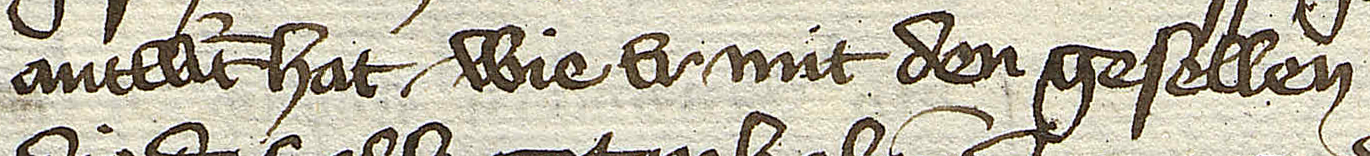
antw*t hat / wie Er mit den geſellen
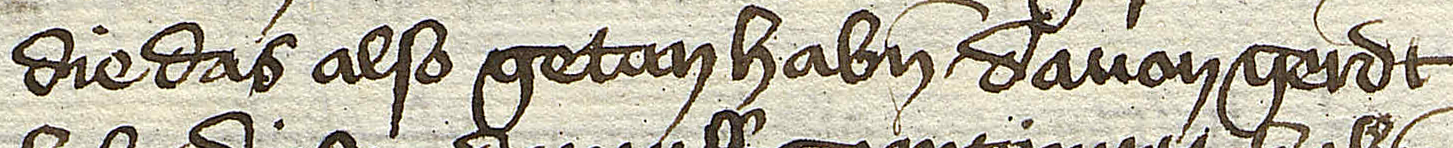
die das alſo getan habn* / dauon gerdt
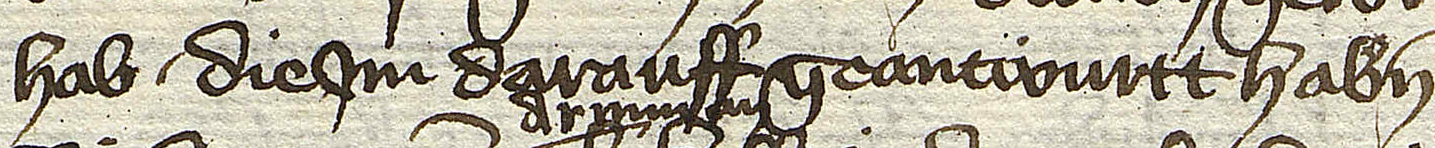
hab / die Im darauff geantwurtt habn*
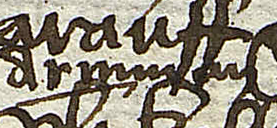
Armman
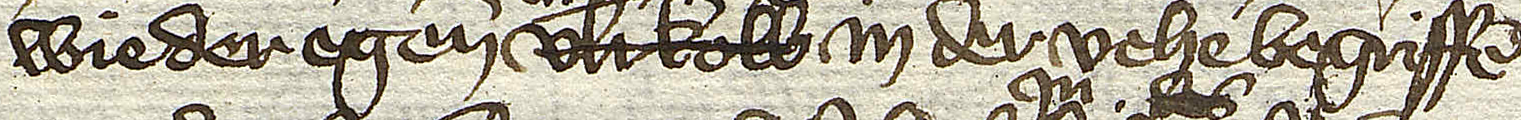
wie der egen* vlr* kolb in der vehe begriffe*
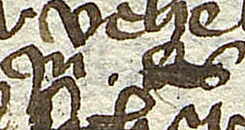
In des
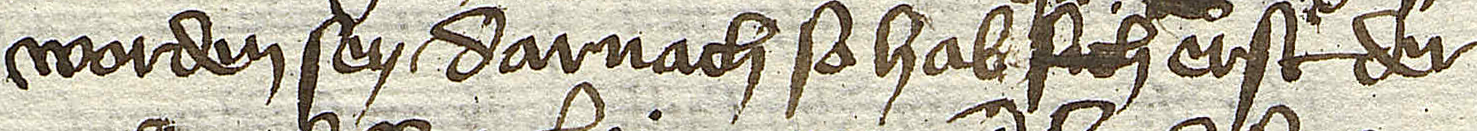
worden ſey / darnach ſo hab ſich erſt der
